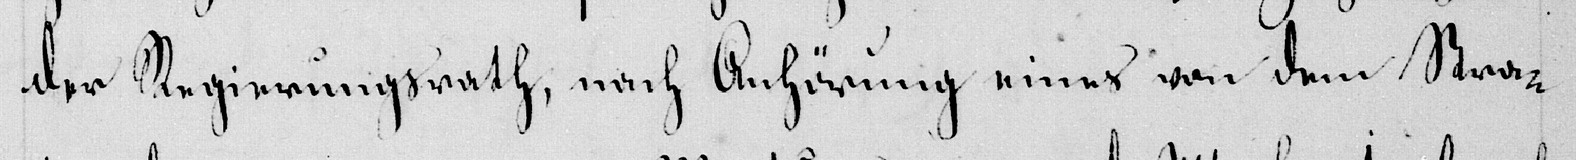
der Regierungsrath, nach Anhörung eines von dem Stra¬
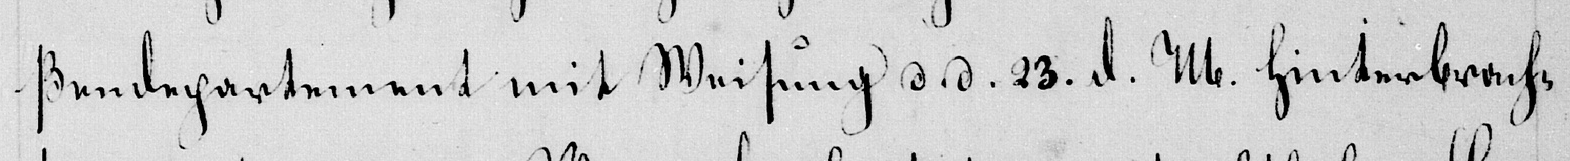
ßendepartement mit Weisung d. d. 23. d. M. hinterbrach¬
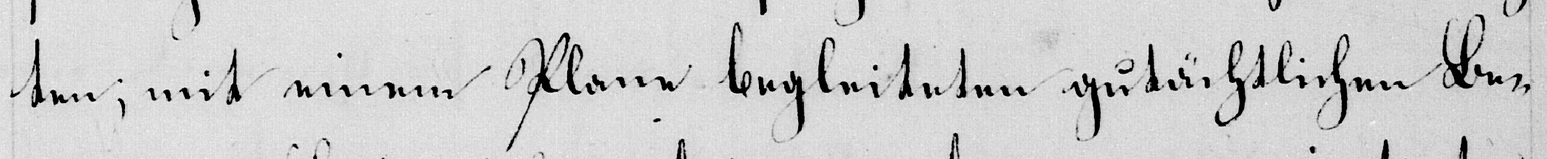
ten, mit einem Plane begleiteten gutächtlichen Be¬
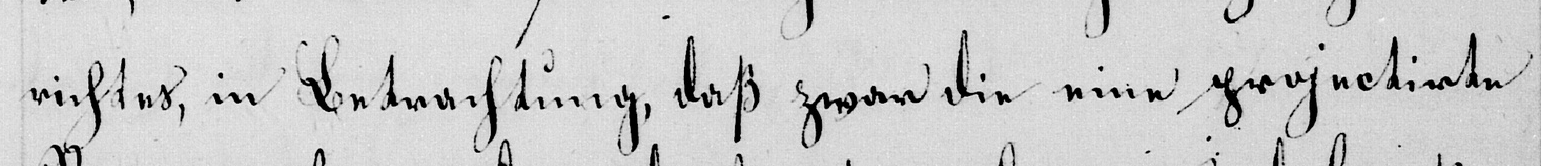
richtes, in Betrachtung, daß zwar die eine projectirte
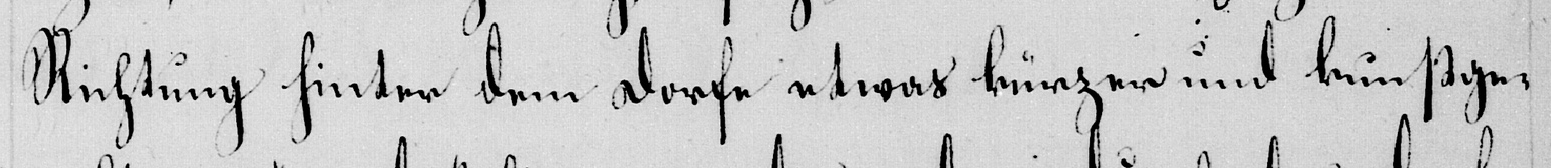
Richtung hinter dem Dorfe etwas kürzer und kunstge¬
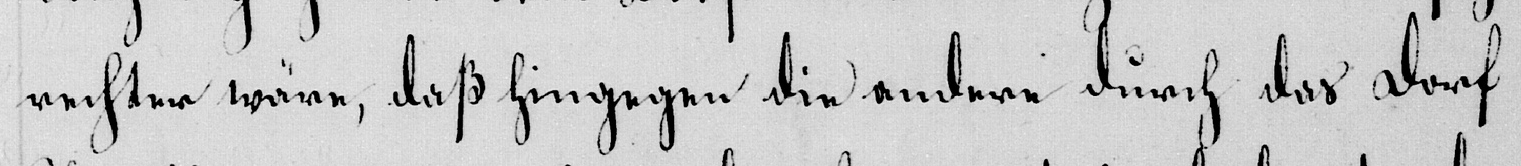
rechter wäre, daß hingegen die andere durch das Dorf
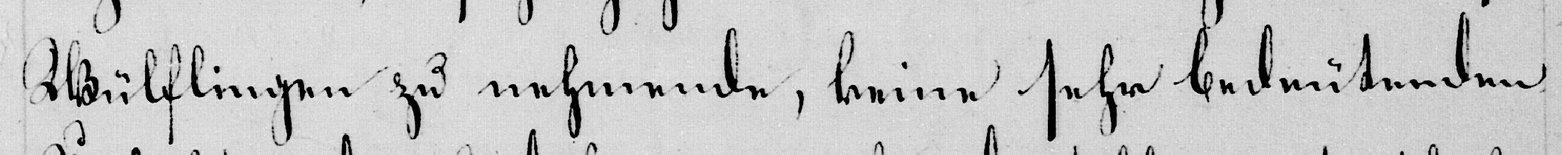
Wülflingen zu nehmende, keine sehr bedeutenden
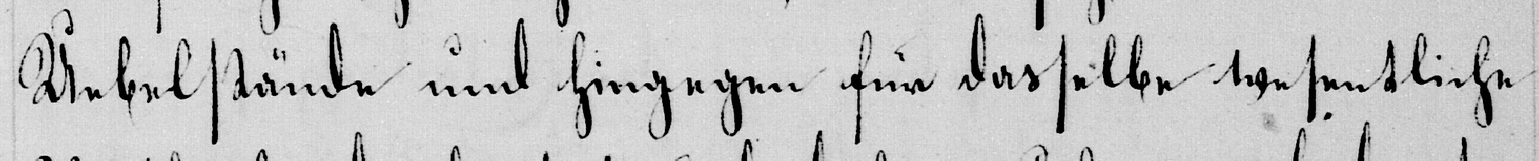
Uebelstände und hingegen für dasselbe wesentliche
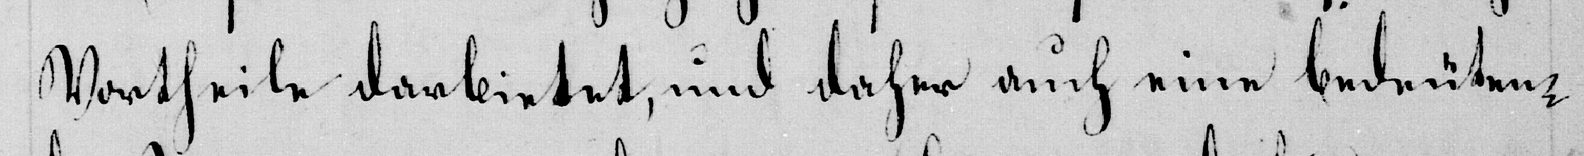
Vortheile darbietet, und daher auch eine bedeuten¬
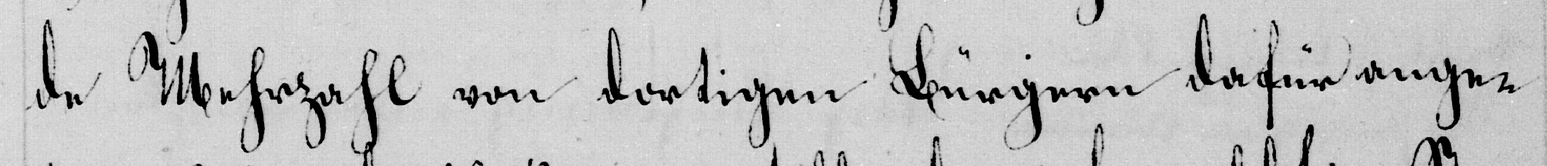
de Mehrzahl von dortigen Bürgern dafür ange¬
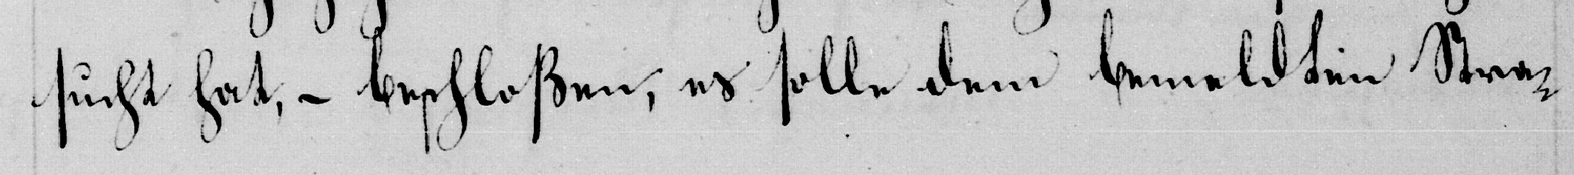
sucht hat, – beschloßen, es solle dem bemeldeten Stra-
